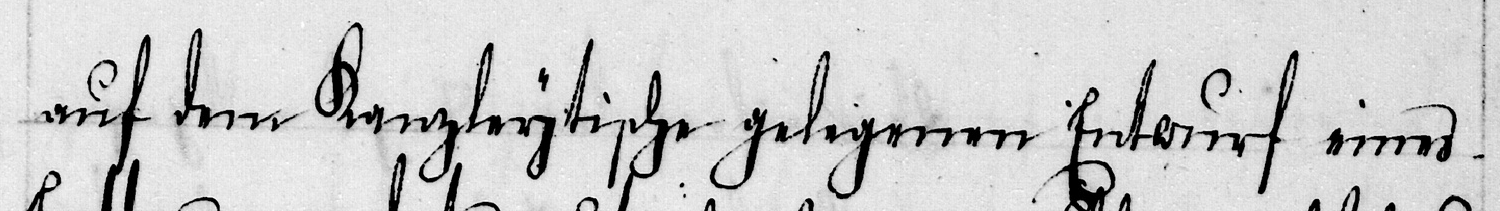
auf dem Kanzleytische gelegenen Entwurf eines
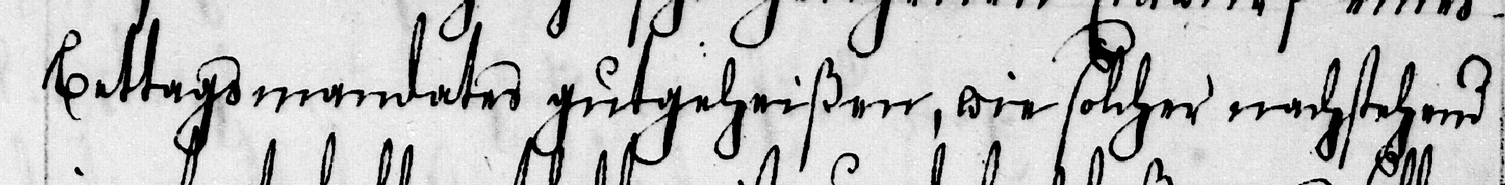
Bettagsmandates gutgeheißen, wie solcher nachstehend
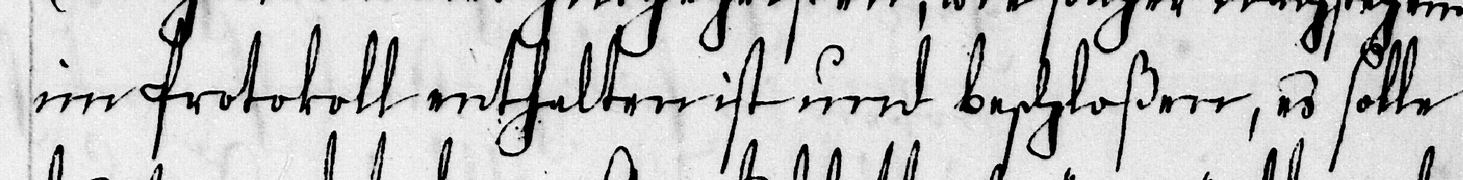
im Protokoll enthalten ist und beschloßen, es solle
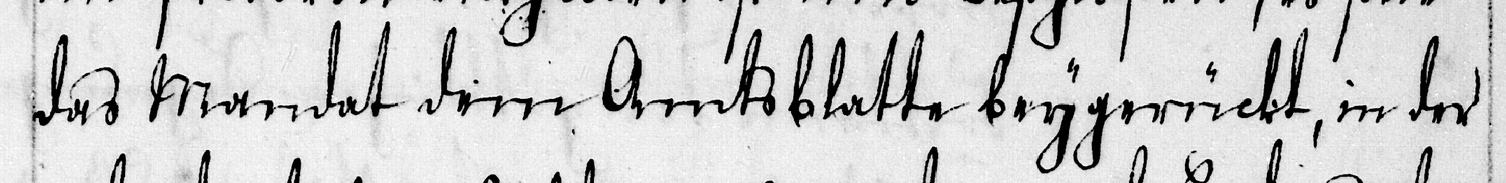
das Mandat dem Amtsblatte beygerückt, in der
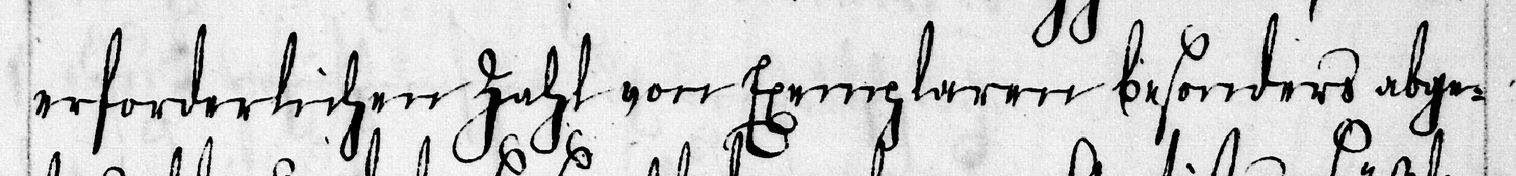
erforderlichen Zahl von Exemplaren besonders abge¬
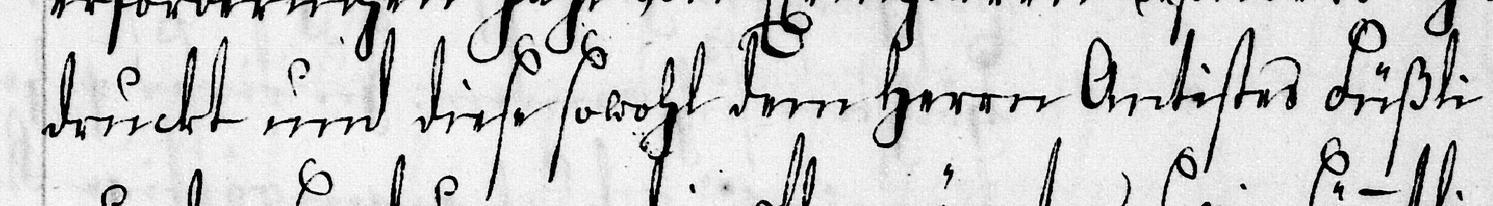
druckt und diese sowohl dem Herrn Antistes Füßli
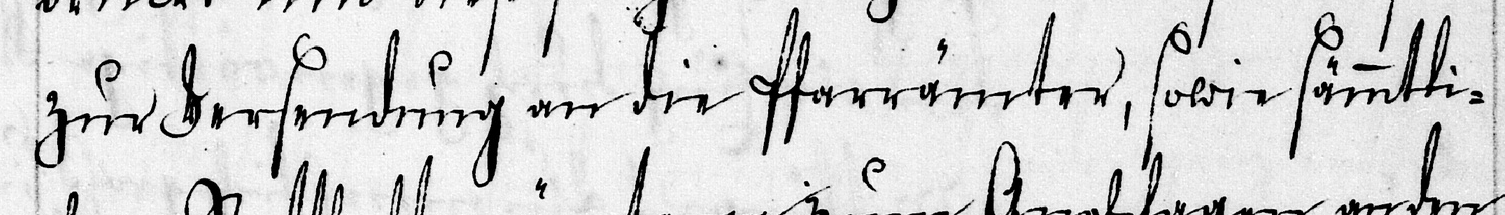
zur Versendung an die Pfarrämter, sowie sämmtli¬
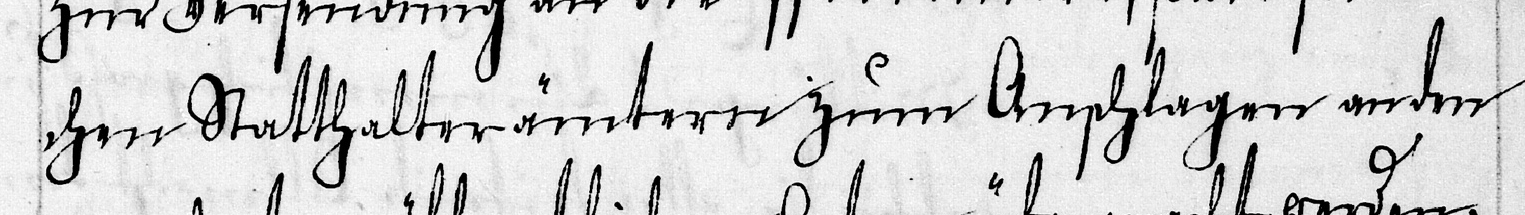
chen Statthalterämtern zum Anschlagen an den
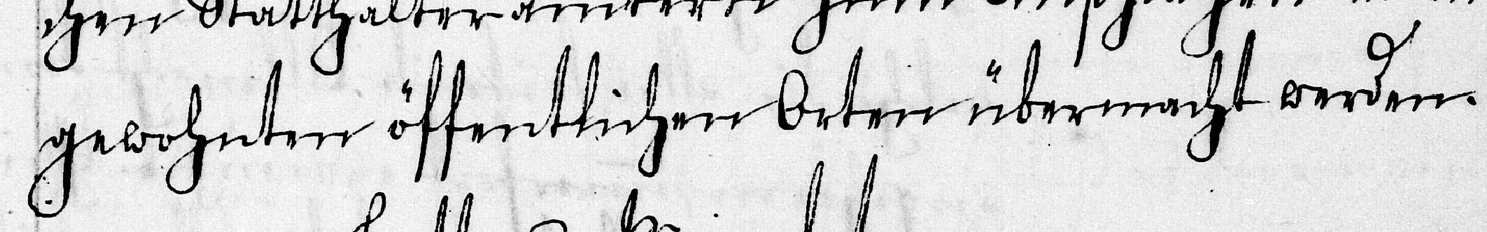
gewohnten öffentlichen Orten übermacht werden.
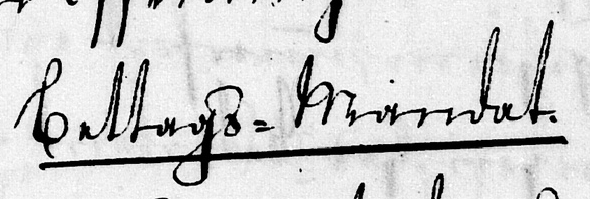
Bettags-Mandat.
